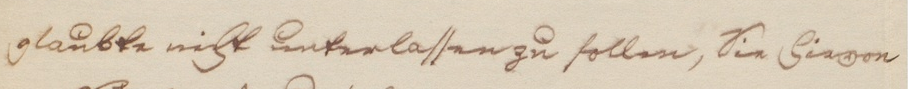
glaube nicht unterlassen zu sollen, Sie hievon
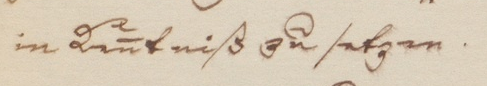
in Kenntniß zu setzen.
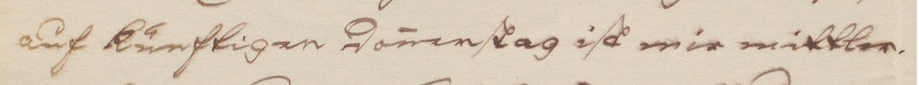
auf künftigen Donnerstag ist mir mittler-
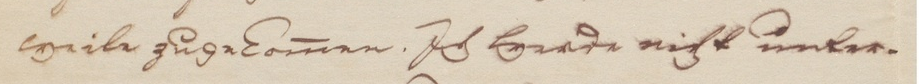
weile zugekommen. Ich werde nicht unter-
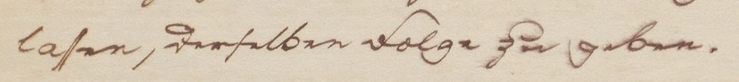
lassen, derselben Folge zu geben.
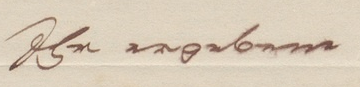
Ihr ergebener
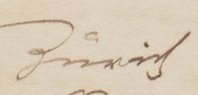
Zürich
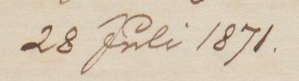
28 Juli 1871.
